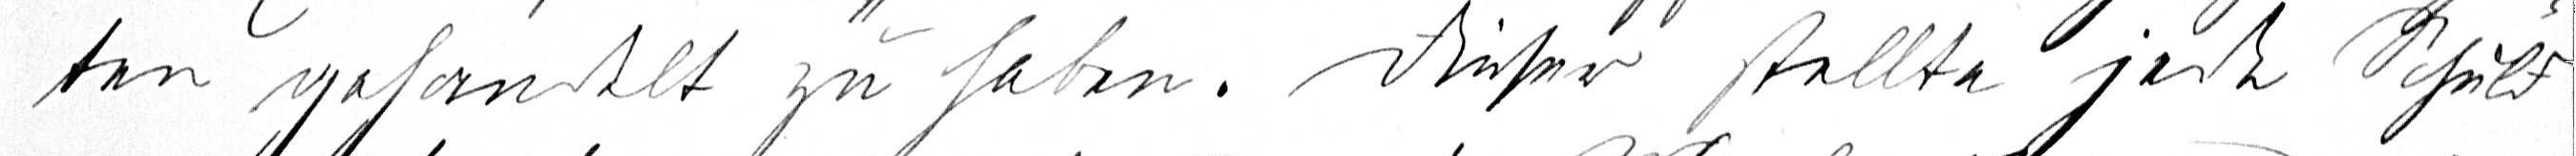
ten gehandelt zu haben. Dieser stellte jede Schuld
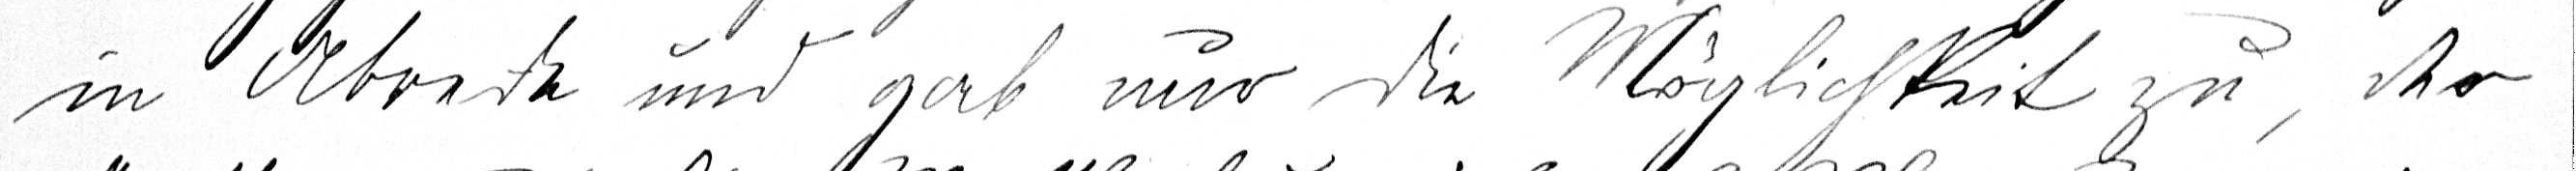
in Abrede und gab nur die Möglichkeit zu, der
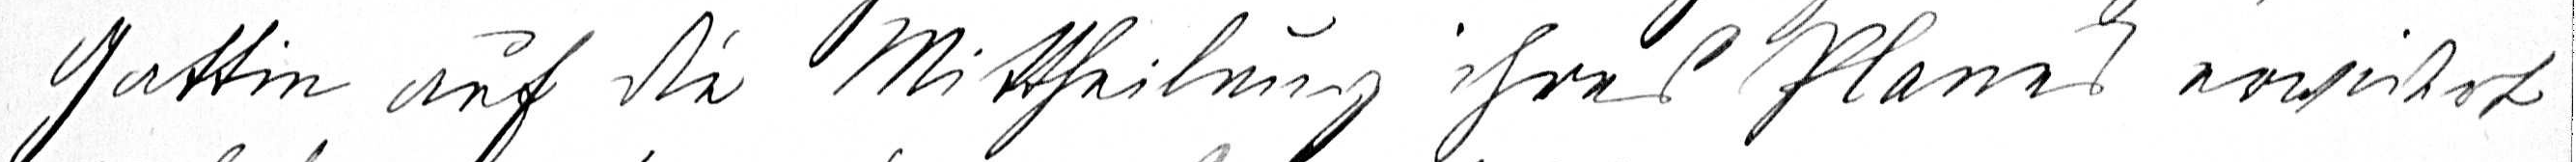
Gattin auf die Mittheilung ihres Planes erwidert
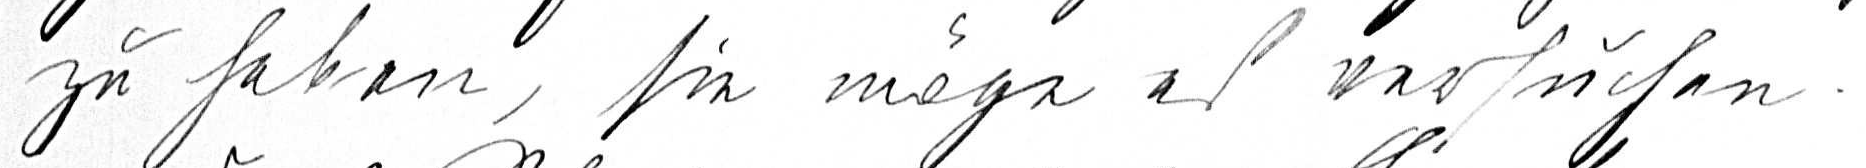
zu haben, sie möge es versuchen.
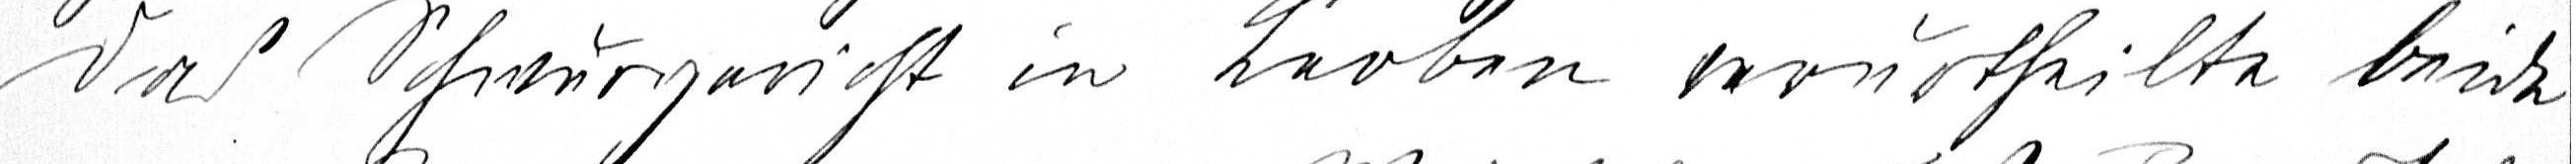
Das Schwurgericht in Leoben verurtheilte beide
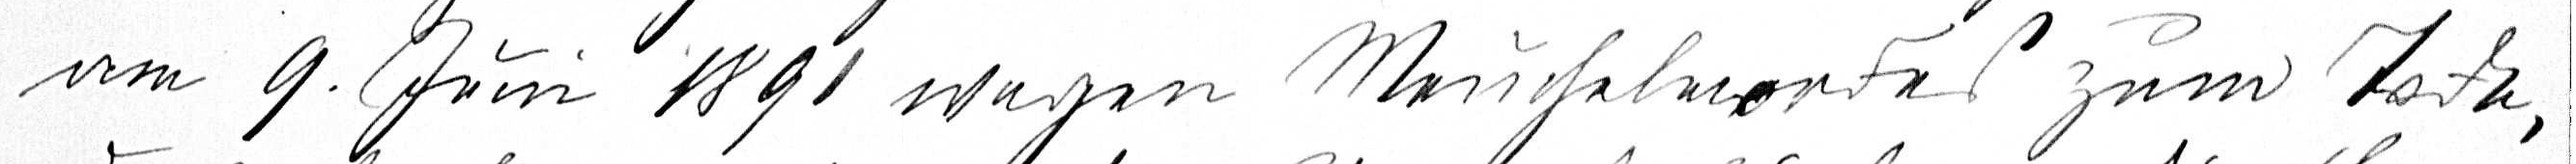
am 9. Juni 1891 wegen Meuchelmordes zum Todes,
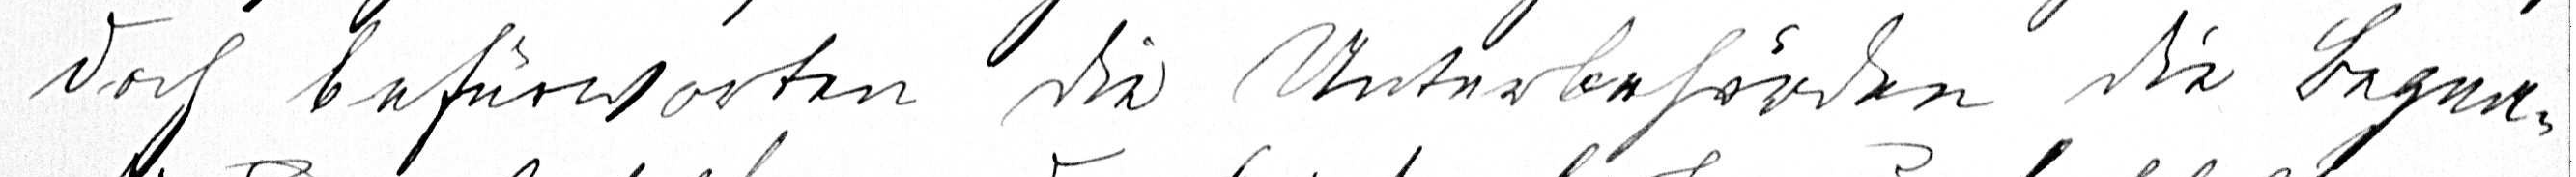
doch befürworten die Unterbehörden die Begna¬
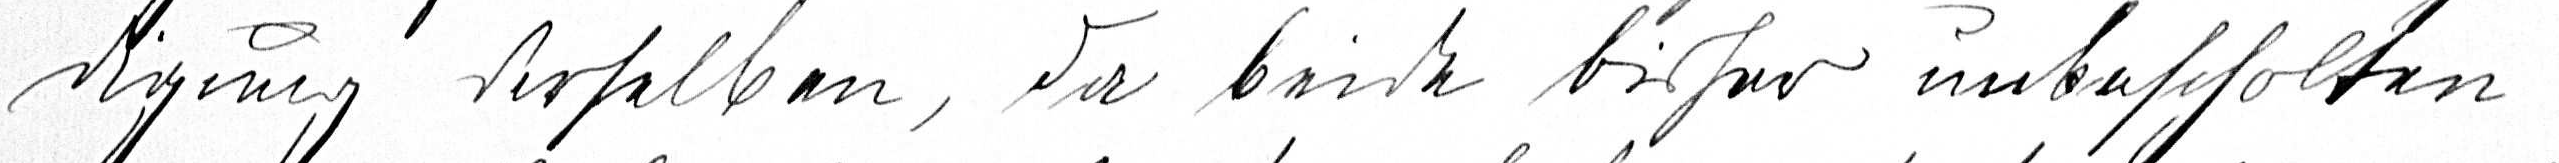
digung derselben, da beide bisher unbescholten
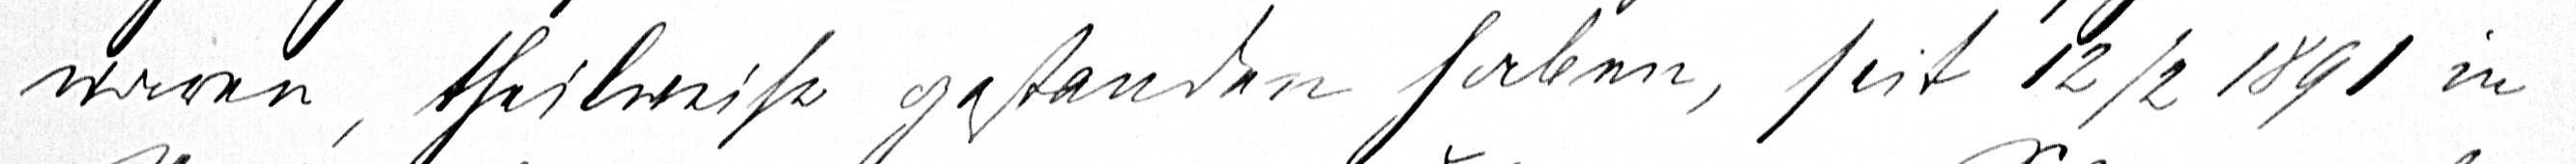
waren, theilweise gestanden haben, seit 12/2 1891 in
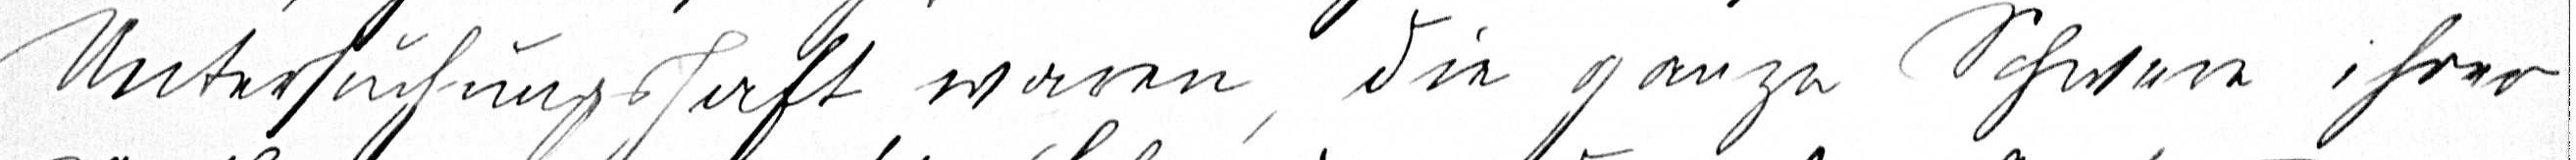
Untersuchungshaft waren, die ganze Scwhere ihrer
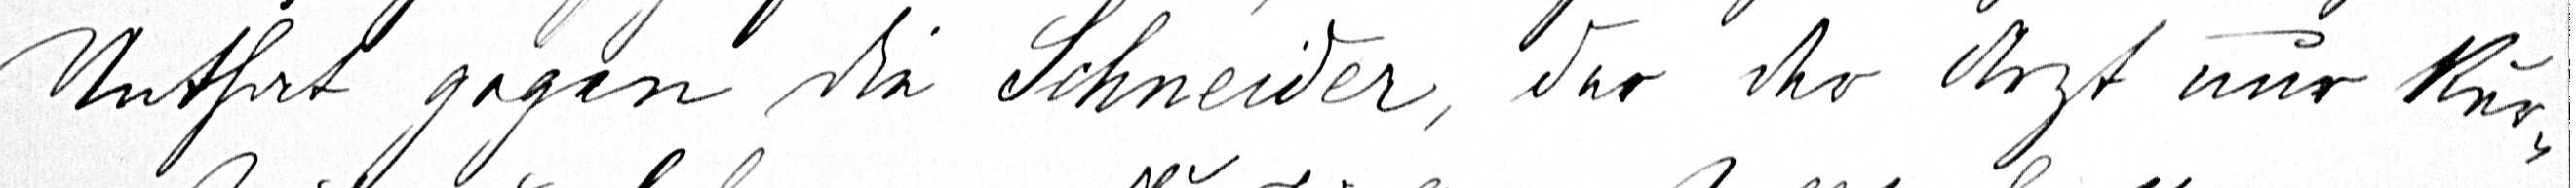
Unthat gegen die Schneider, der ihr Arzt nur kur¬
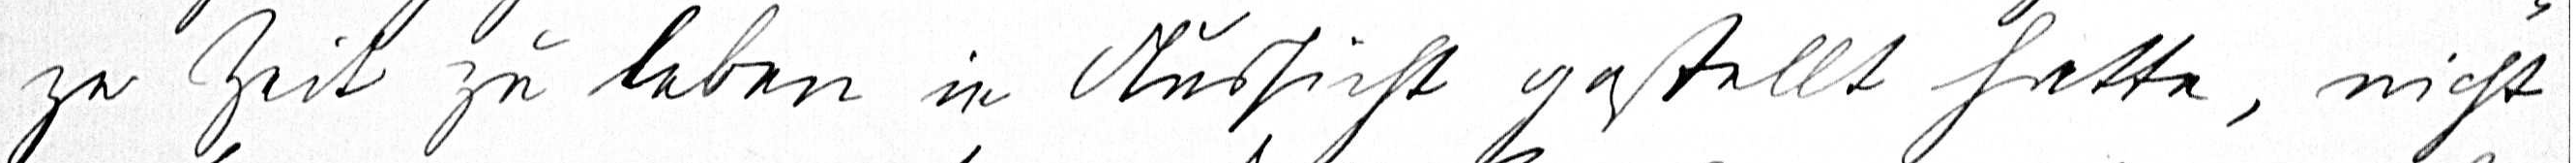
ze Zeit zu leben in Aussicht gestellt hatte, nicht
